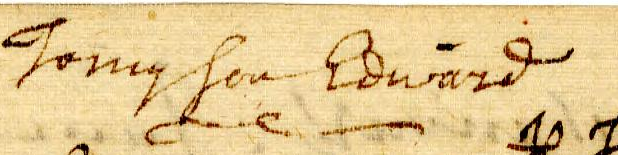To my Son Edward
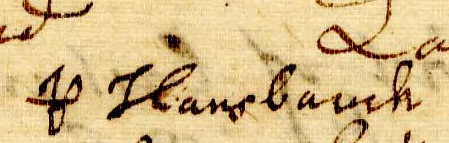per Hambauch
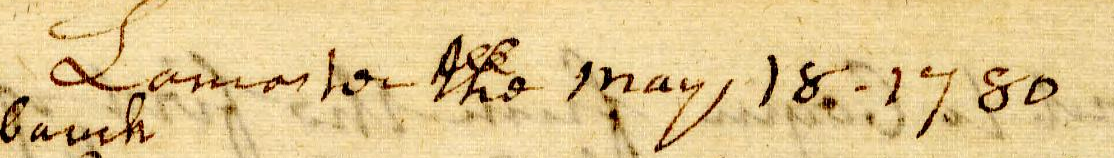Lancaster the May 18- 1780
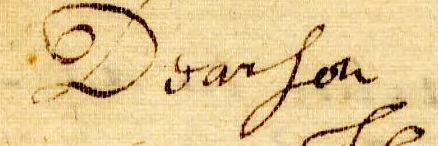Dear Son
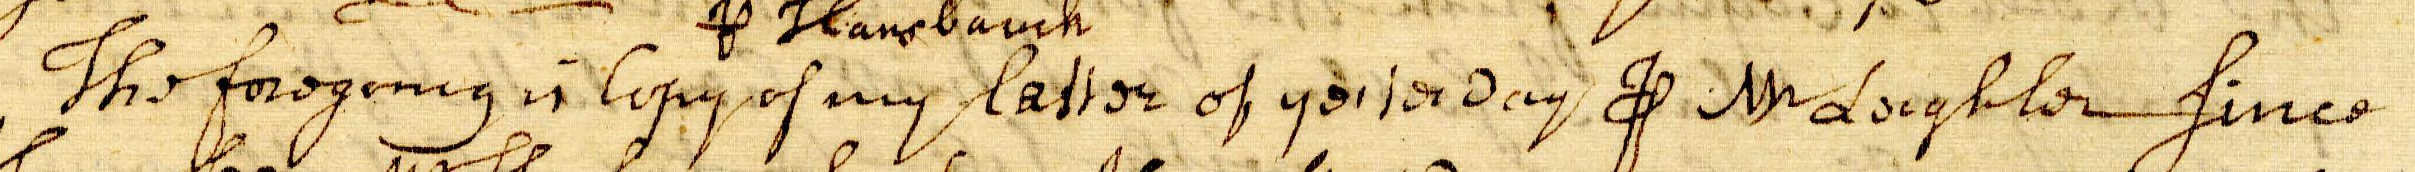The foregoing is Copy of my letter of yesterday per M^r Leighton since
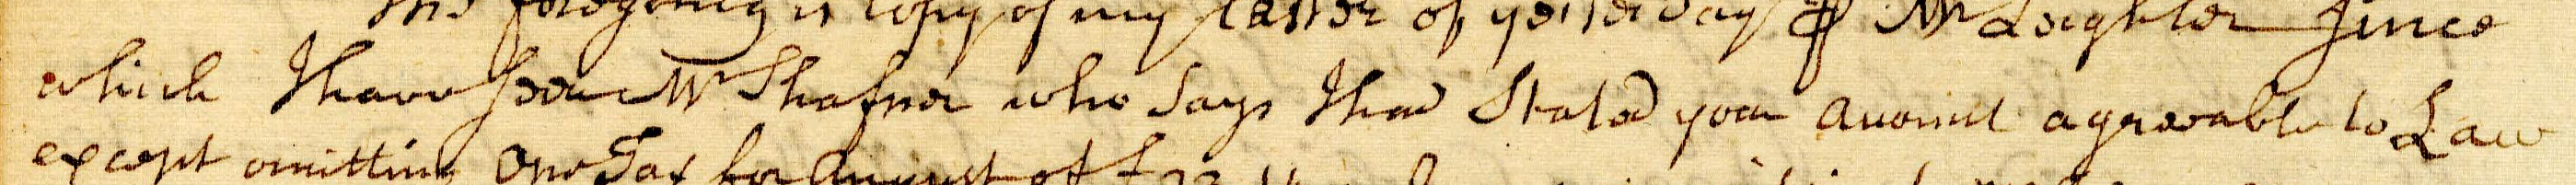which I have seen M^r Shafner who says I had Stated your Account agreeable to Law
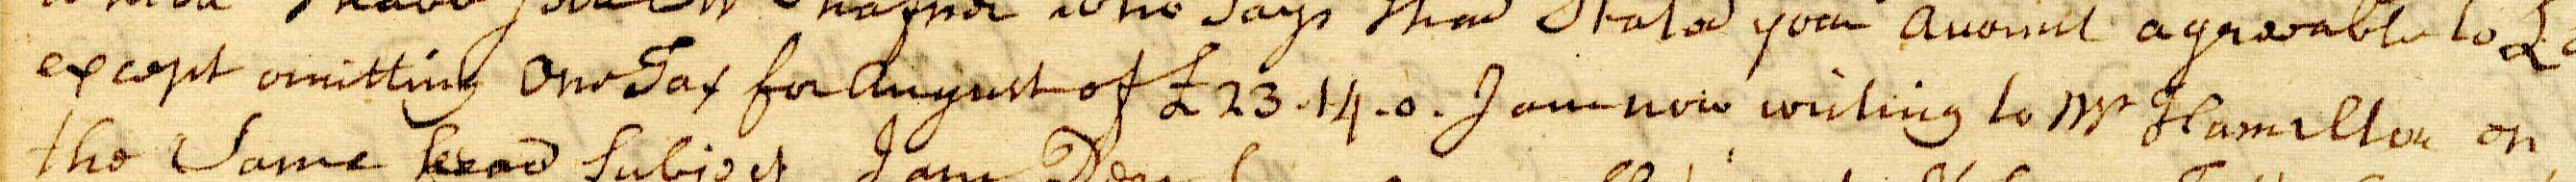except omitting Our Tax for August of £23.14.0. I am now writing to M^r Hamilton on
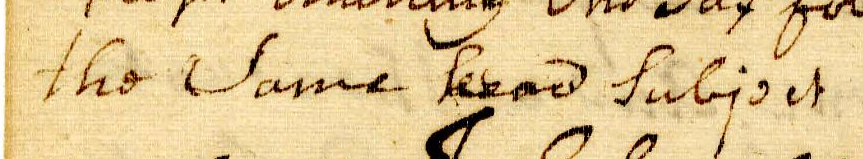the Same [____] Subject
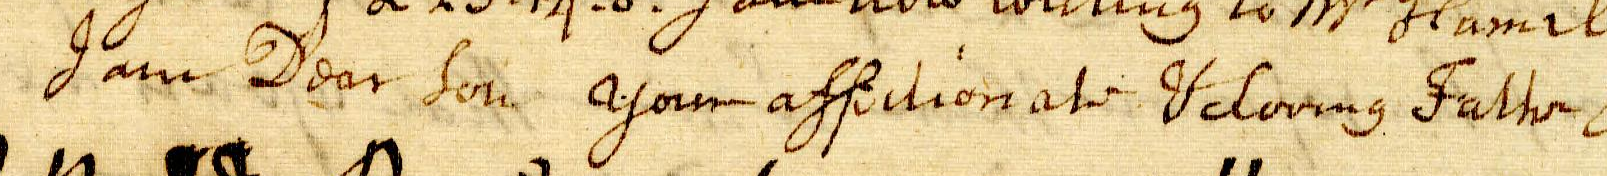I am Dear Son Your affectionate & Loving Father
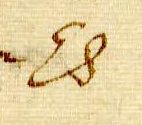ES
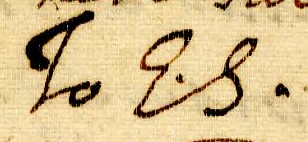To E.S.
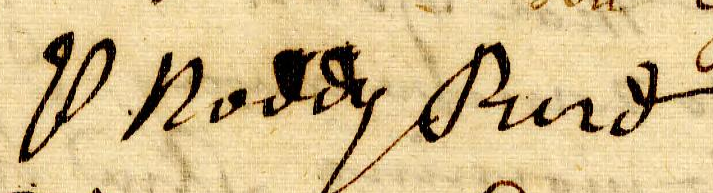per Neddy Burd
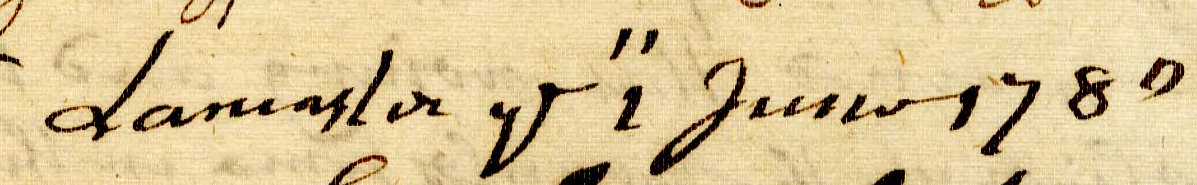Lanaster y^e 1^st June 1780
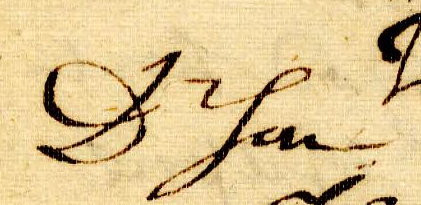D^r Son
